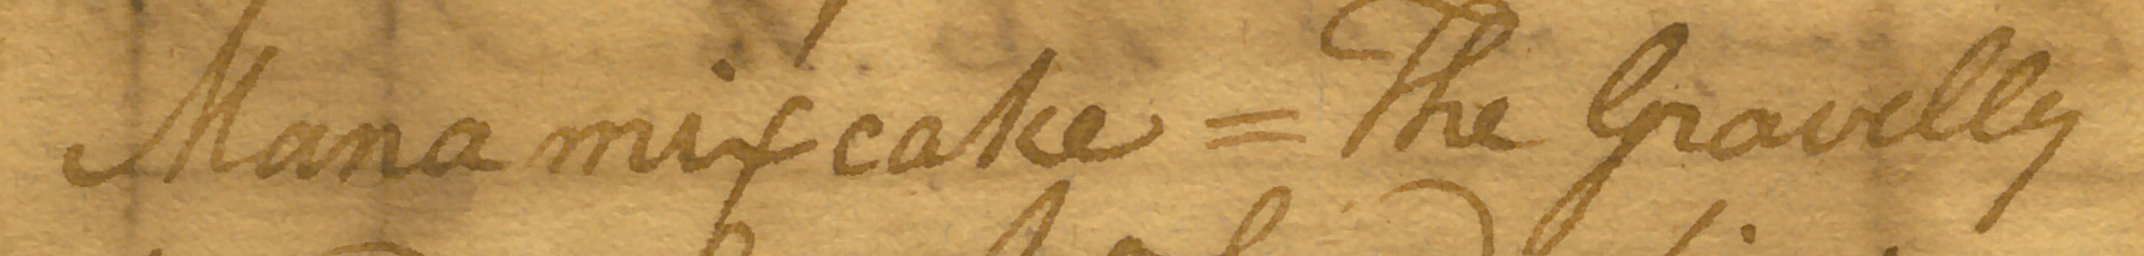Manamixcake = The Gravelly
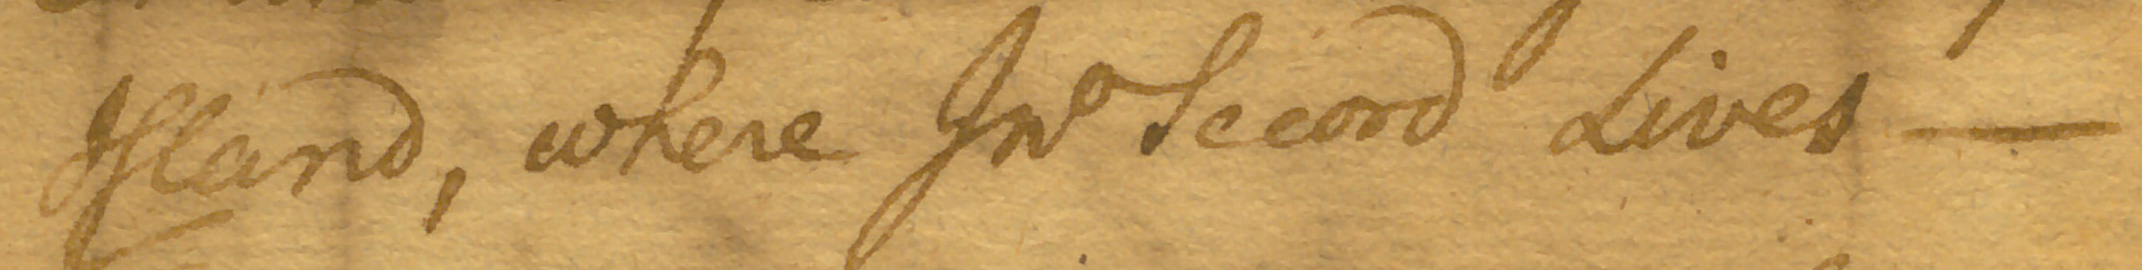Island, where Jn^o Secord Lives-
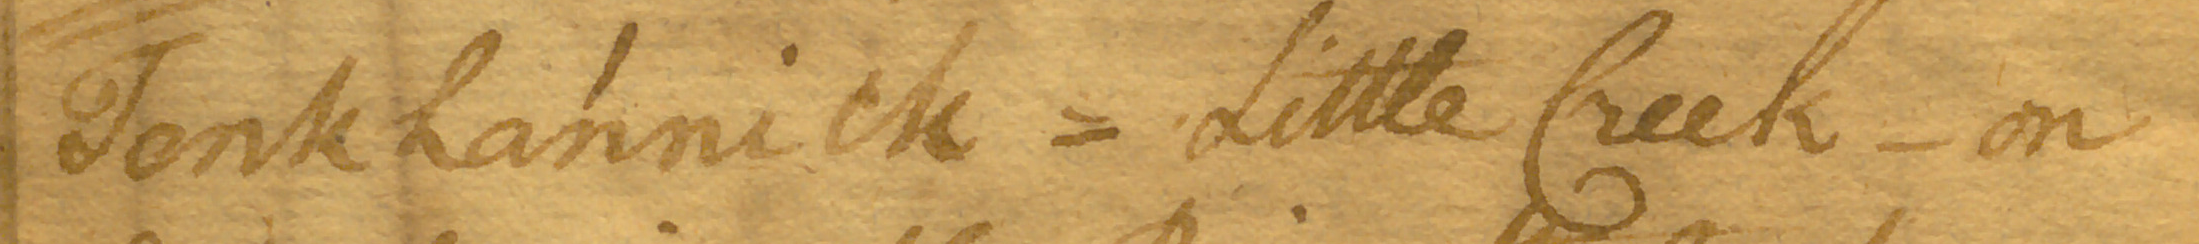Tenkhánnick = Little Creek- on
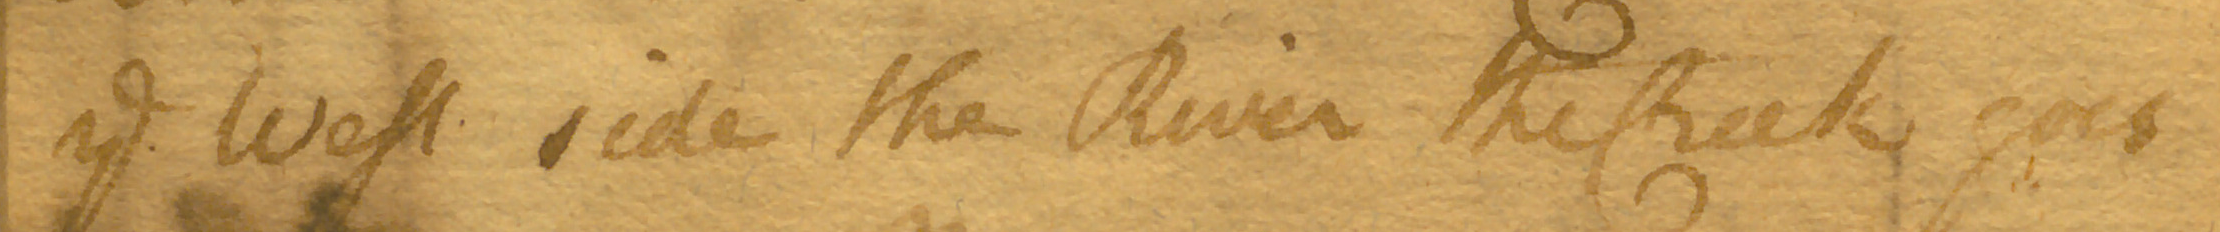y^e West side the River the Creek goes
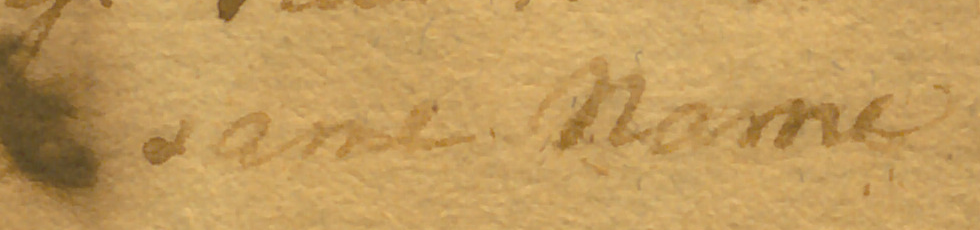same name
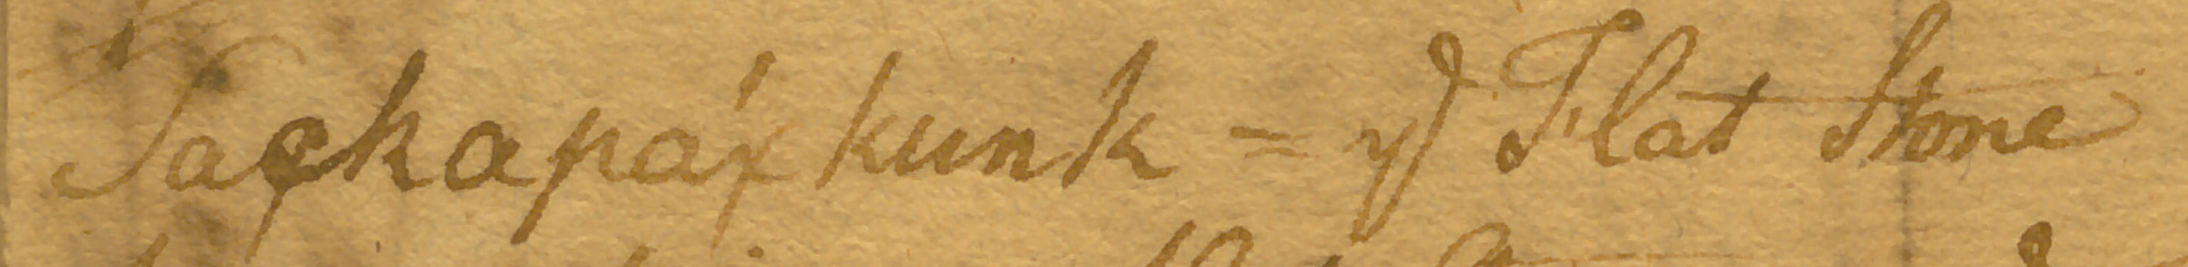Sackapáxkunk = y^e Flat Stone
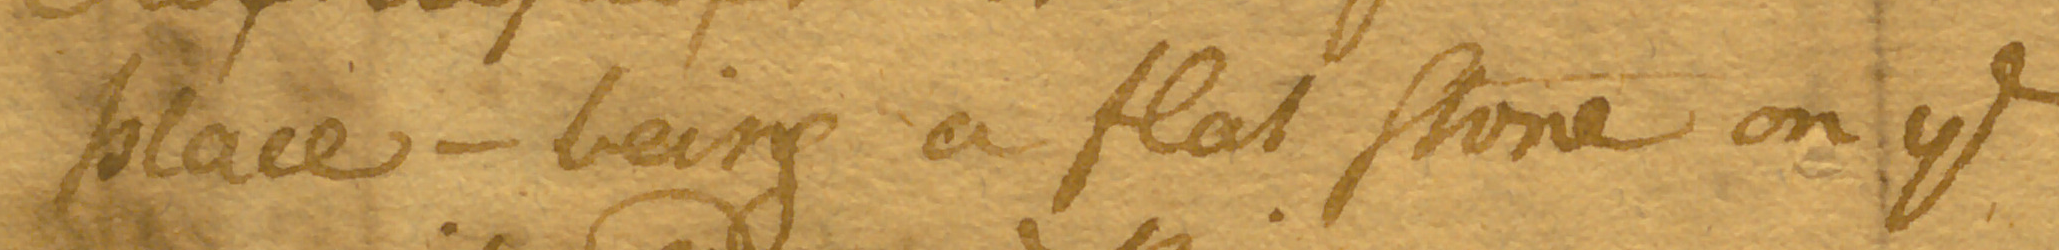place- being a flat stone on y^e
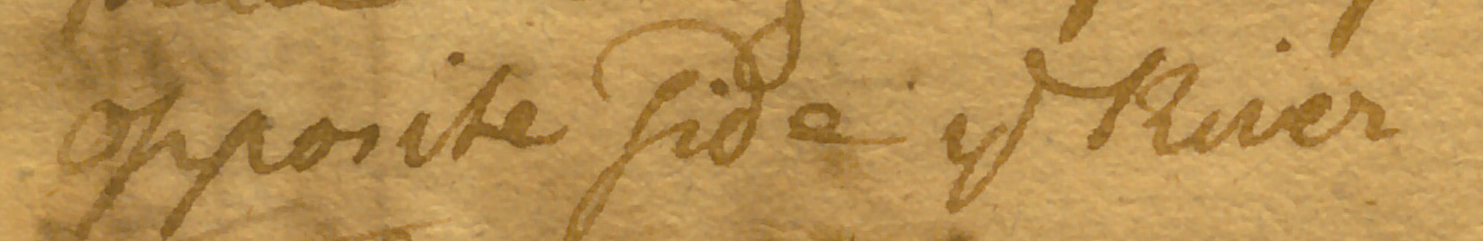opposite side y^e River
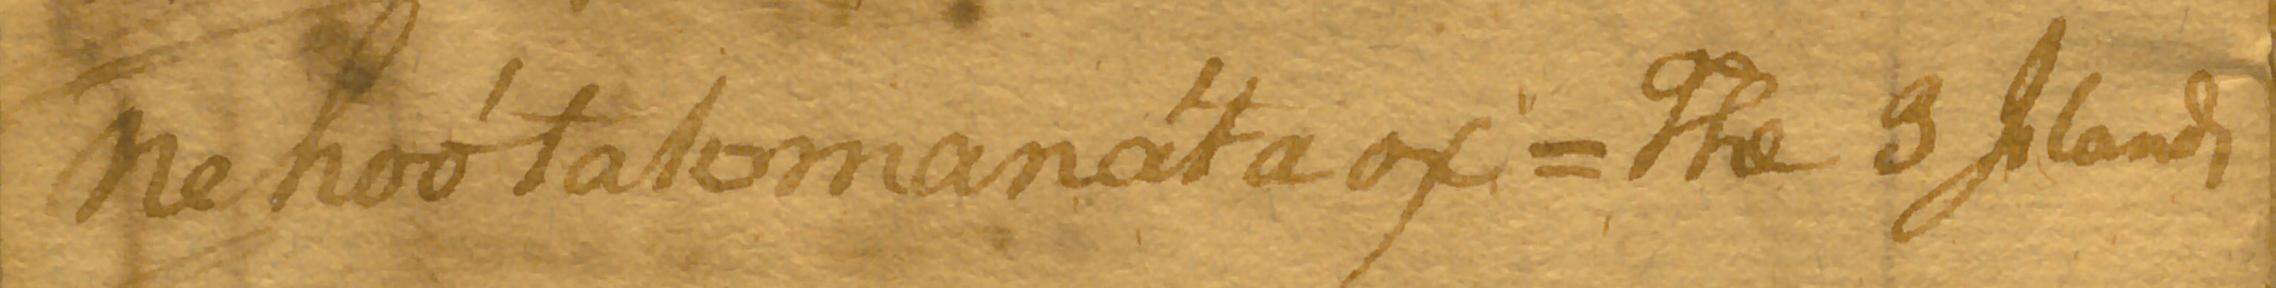nehoótalomanátaox = The 3 Islands
